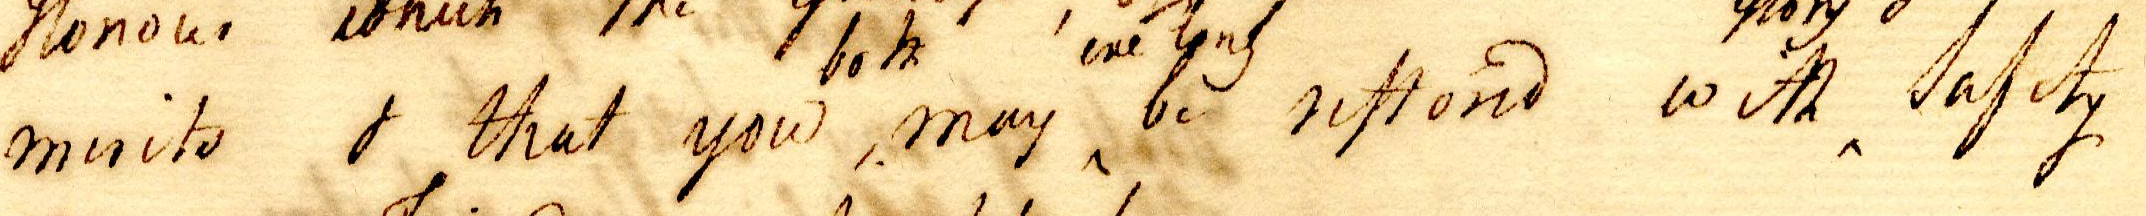merits & that you may ^ be restored with ^ Safety
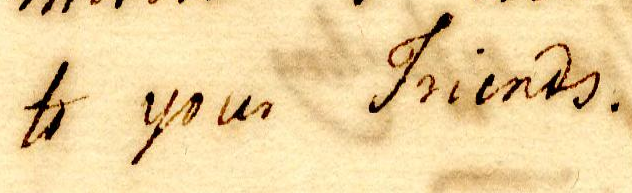to your Friends.
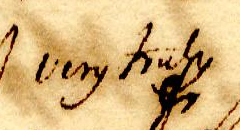very truly
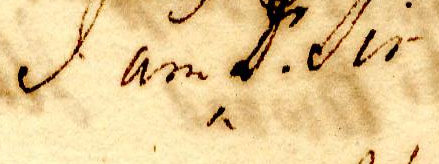I am ^ D^r Sir
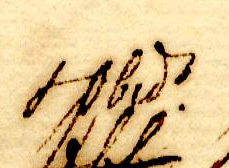& Obed^t.
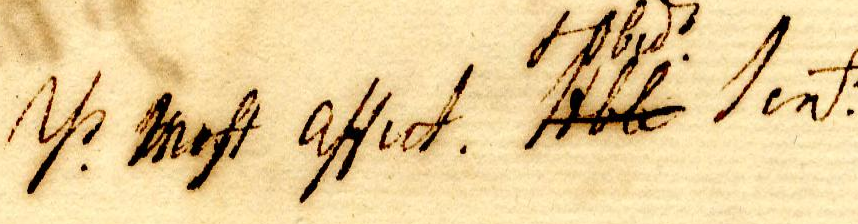Y^r. Most affect. Hble Ser^t.
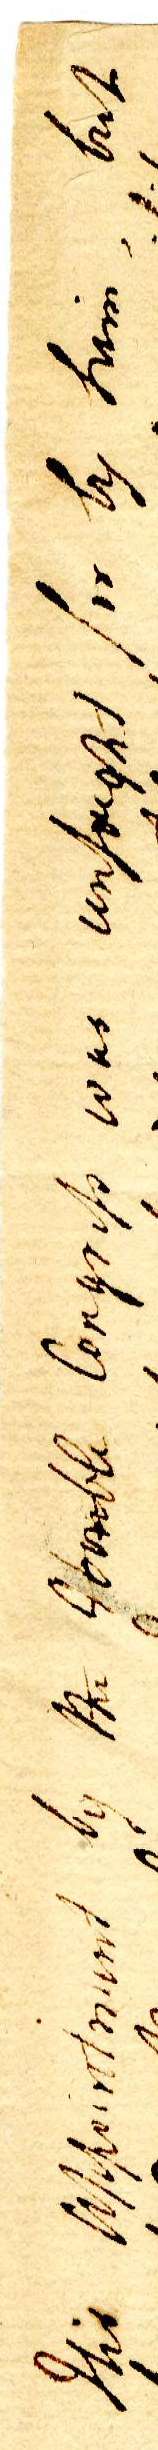This appointment by the Honble Congress was unsought for by him but
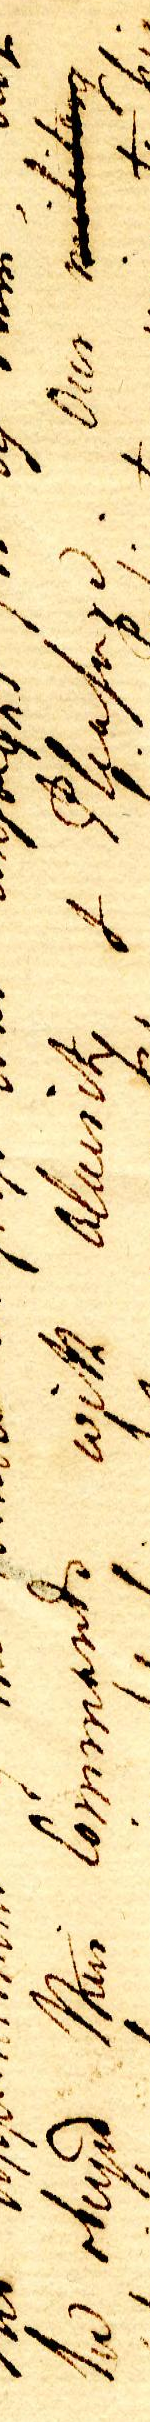he obeyed their Command with Alacrity & Pleasure. Our military
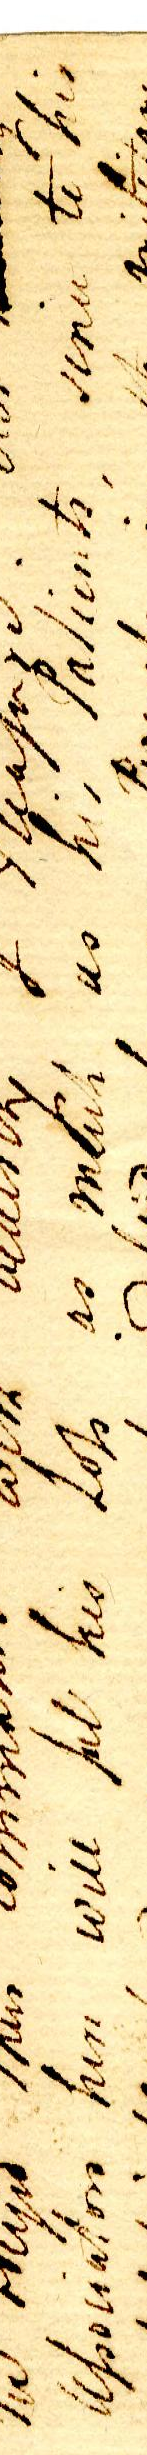Association here will put his Loss as much as his Patients since to his
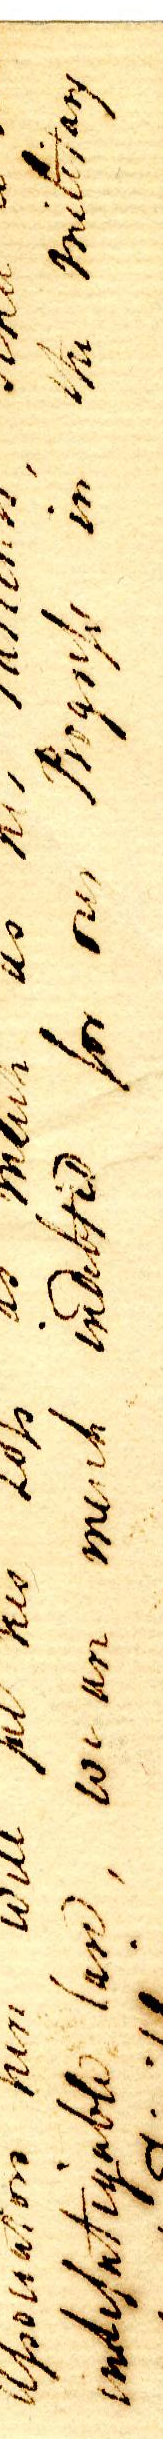indefatigable lan, we are much indebted for our Progress in the military
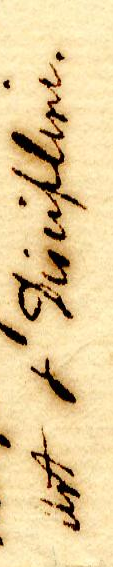Art & Discipline
